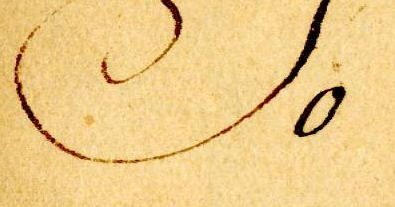To
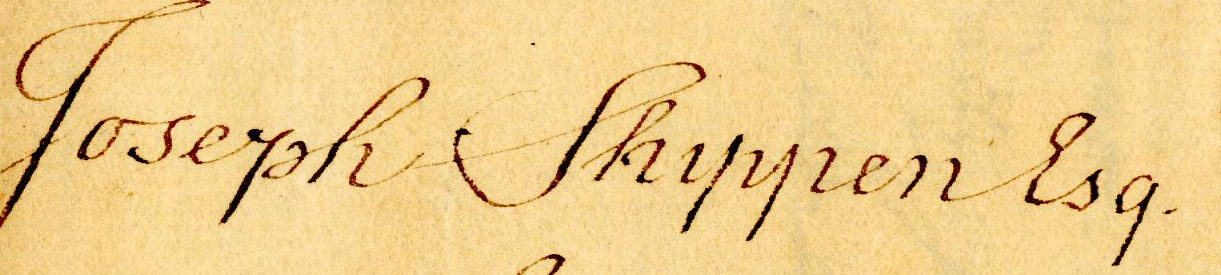Joseph Shippen Esq.
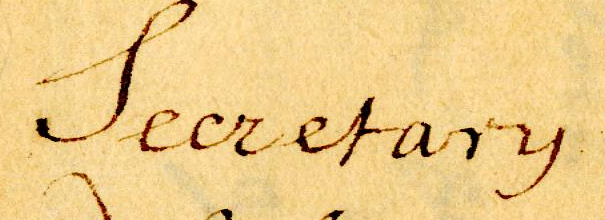Secretary
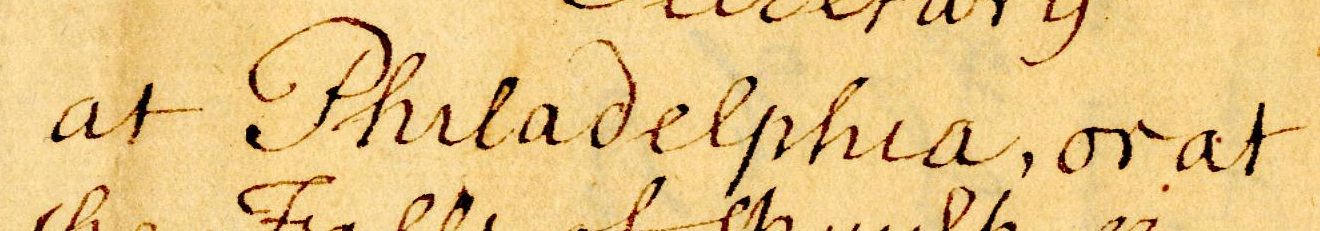at Philadelphia, or at
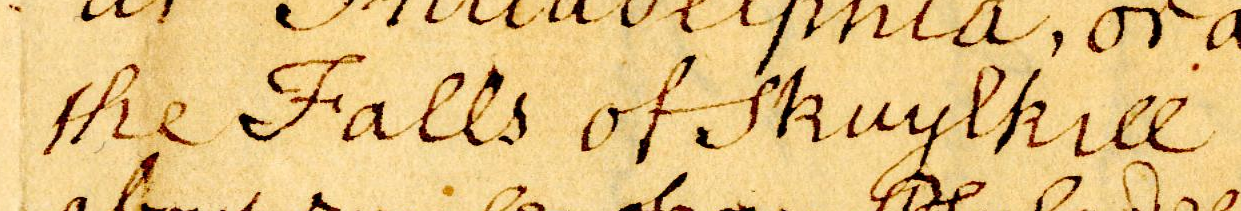the Falls of Skuylkill
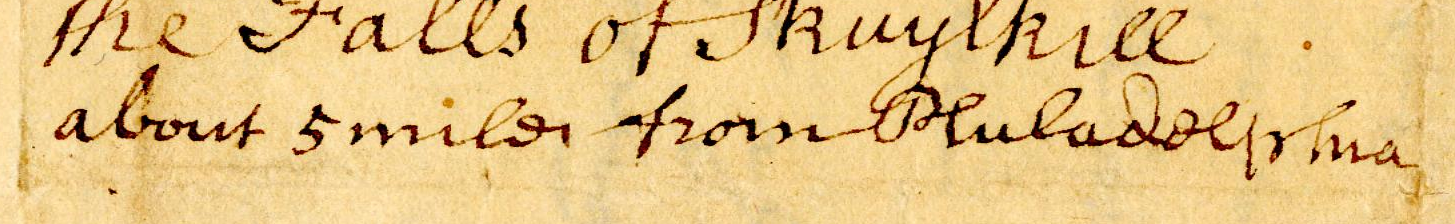about 5 miles from Philadelphia
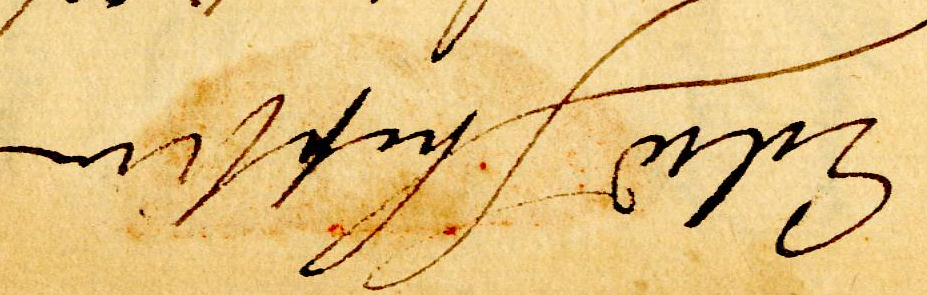Edw Shippen
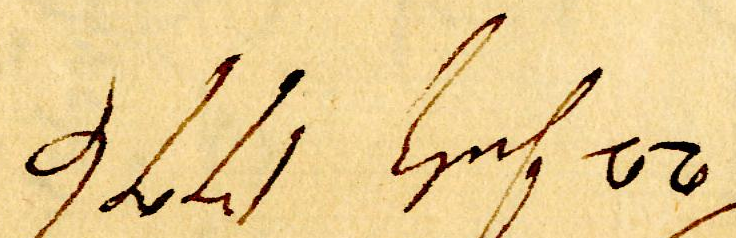22 July 1776
